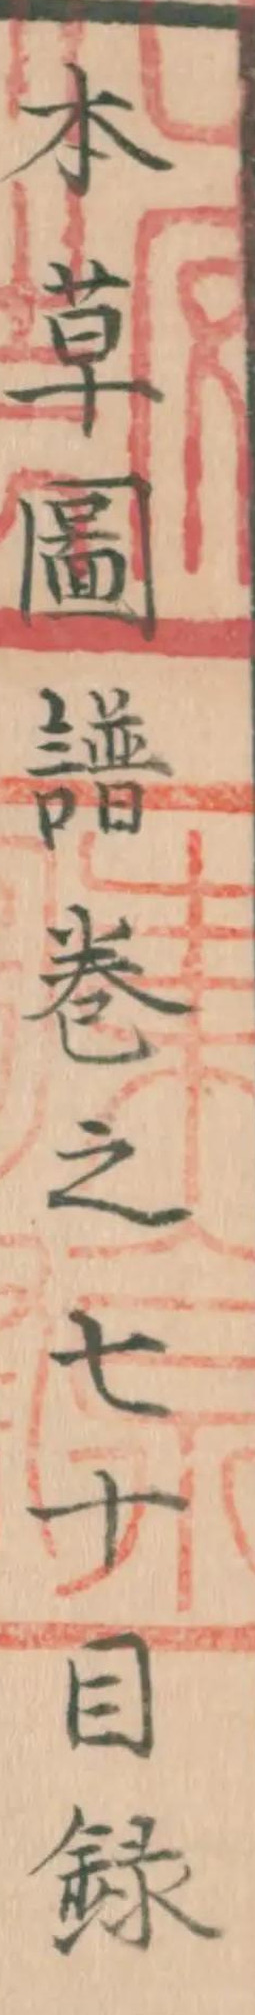本草図譜巻之七十目録

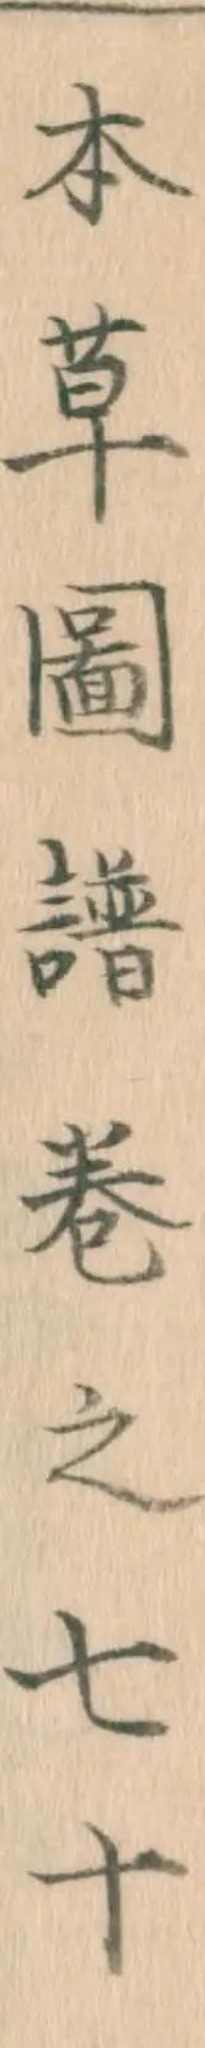本草図譜巻之七十
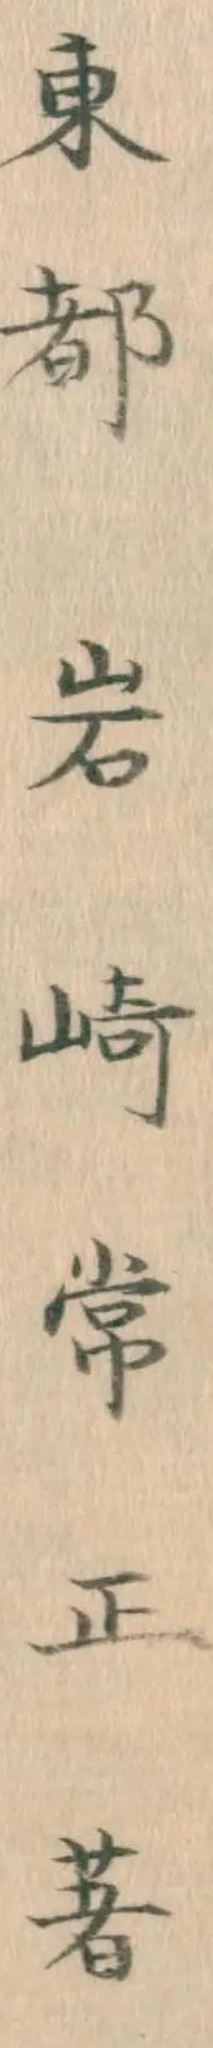東部岩崎常正著
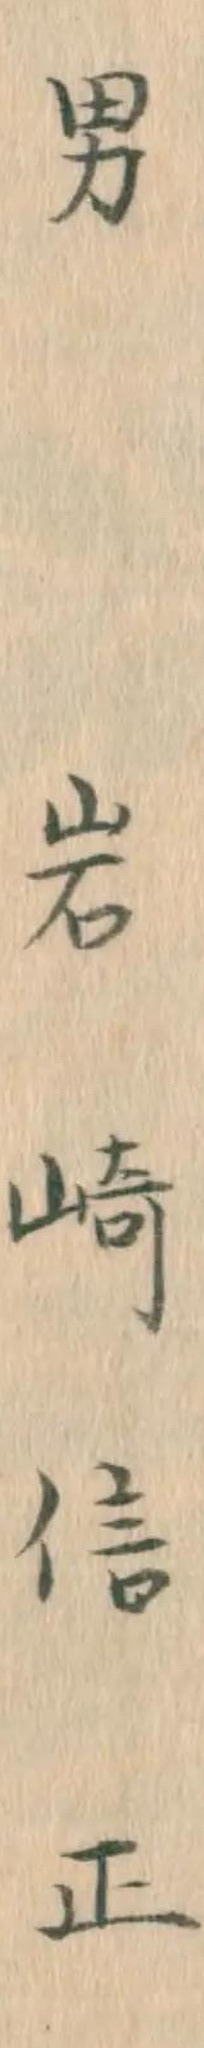男岩崎信正
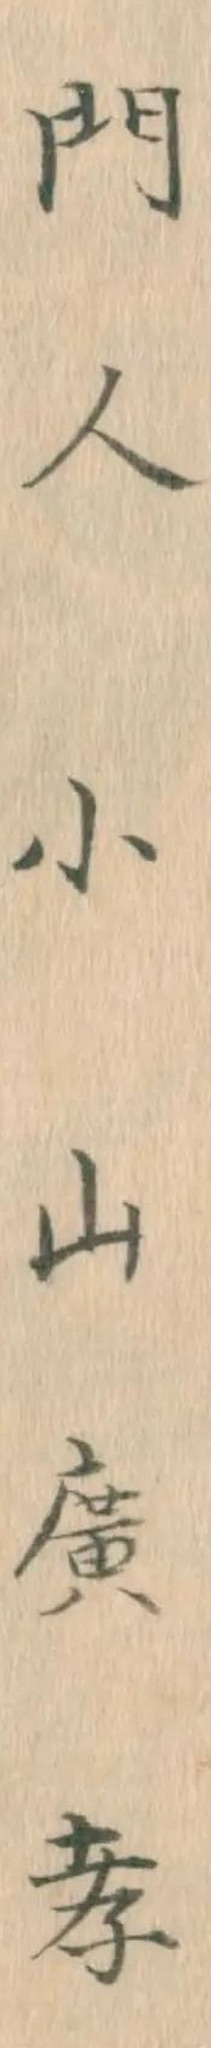門人小山廣孝校
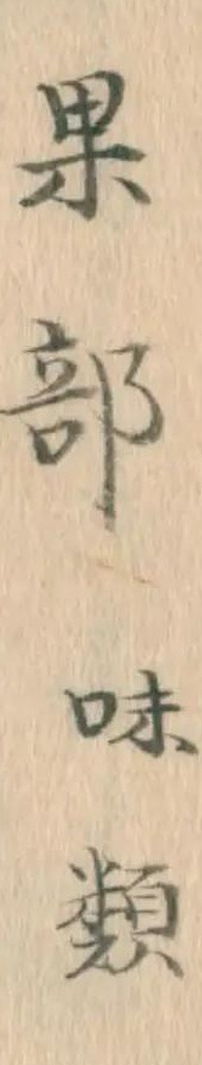果部味類

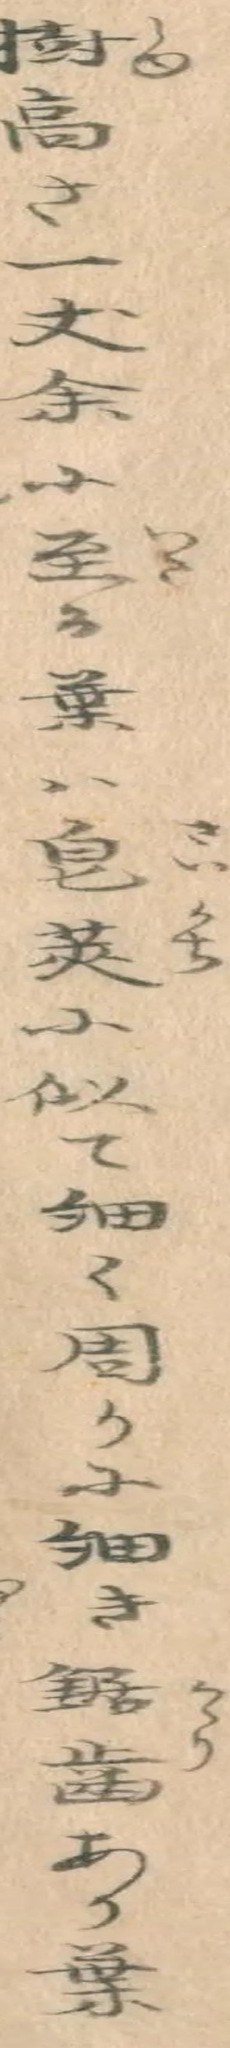樹高さ一丈余に至る葉は皁莢に似て細く周りに細き鋸歯あり葉
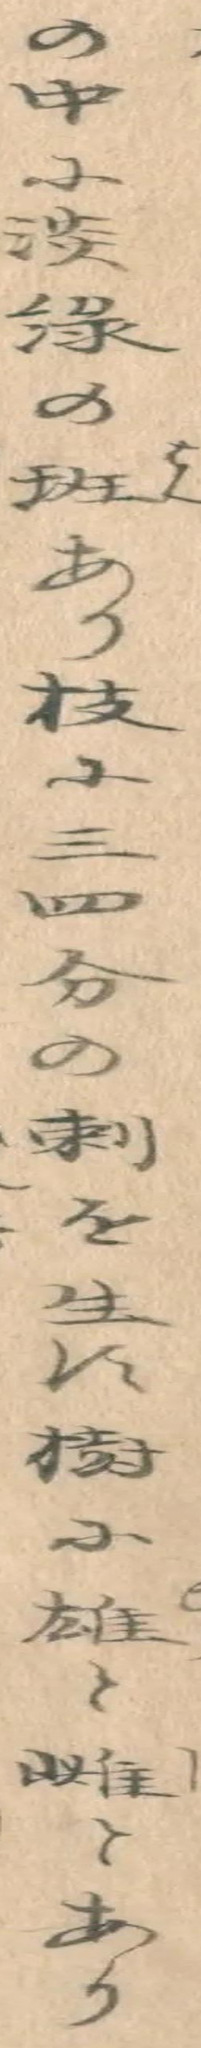の中に淡緑の班あり枝に三四分の刺を生す樹に雄と雌とあり
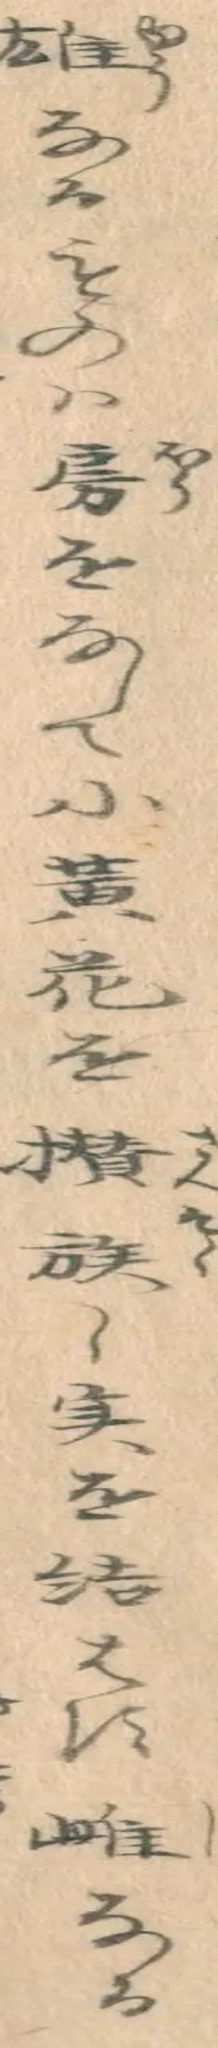雄なるものは房をなして小黄花を攅族し実を結はす雌なる
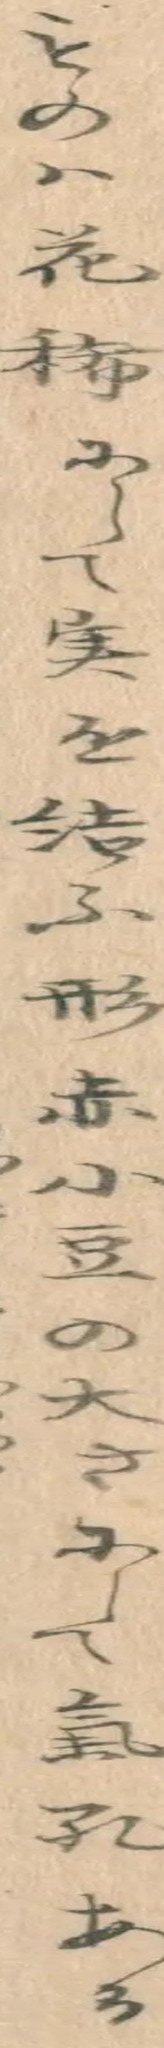ものは花稀にして実を結ふ形赤小豆の大さにして気孔ある
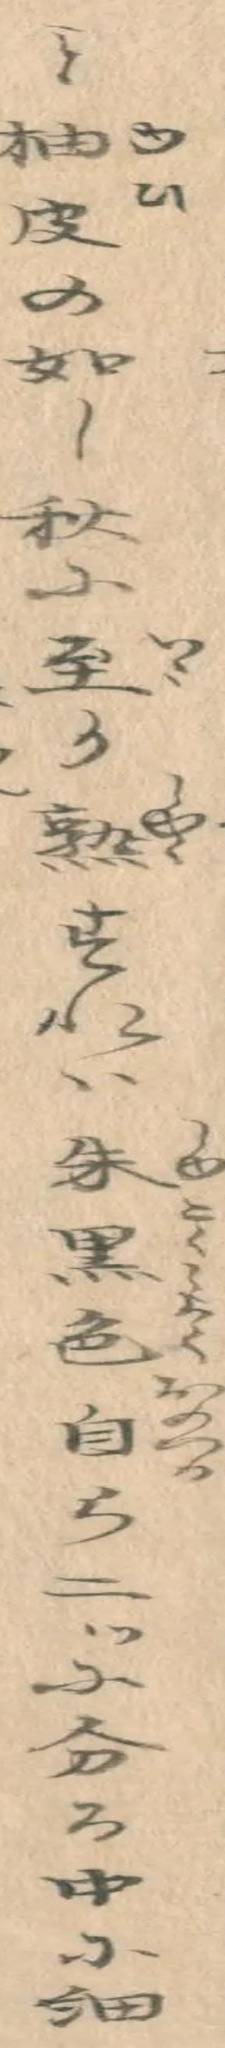こと柚皮の如し秋に至り熟すれは朱黒色自二ツに分る中に細
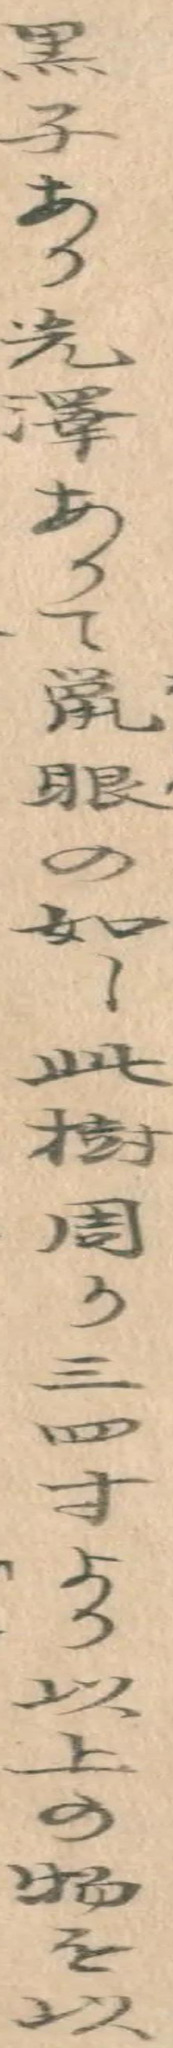黒子あり光沢ありて鼠眼の如し此樹周り三四寸より以上の物を以
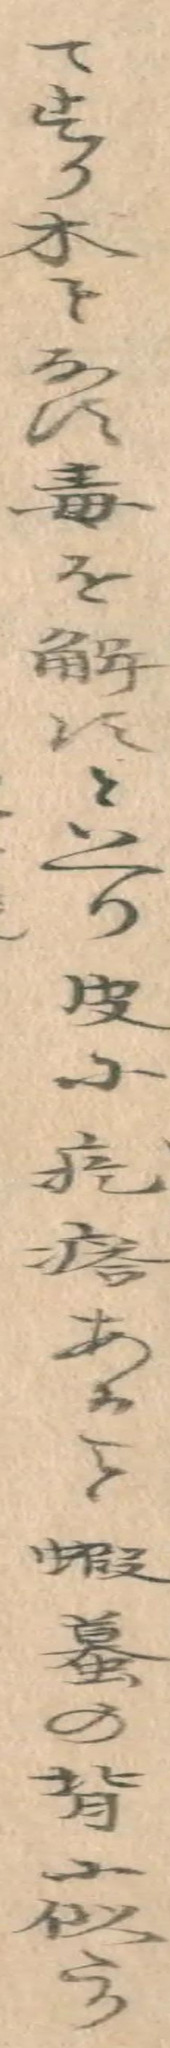てり木をなす毒を解すといへり皮に疱瘡あること蝦蟇の背に似たり
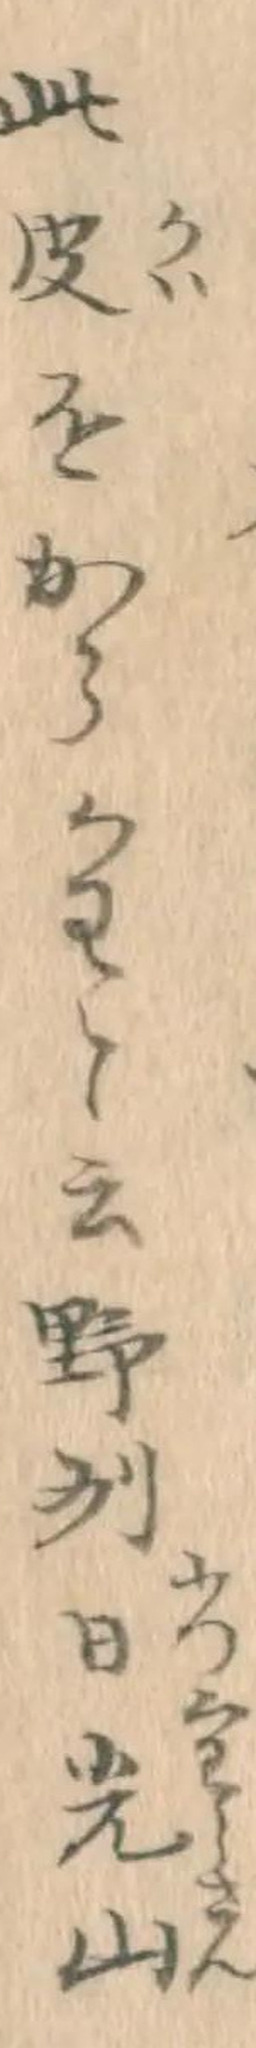此皮をからと云野州日光山
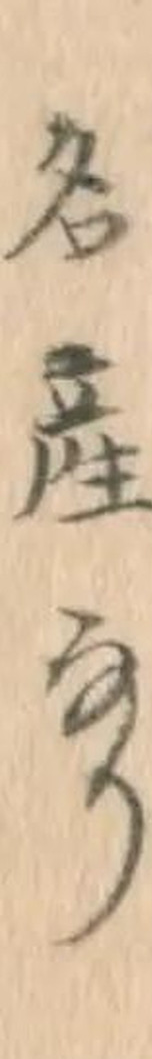名産なり

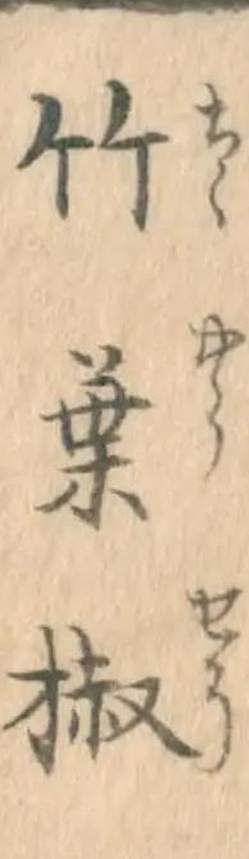竹葉椒
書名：本草図譜. 巻70-72
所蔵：国立国会図書館 National Diet Library, JAPAN
